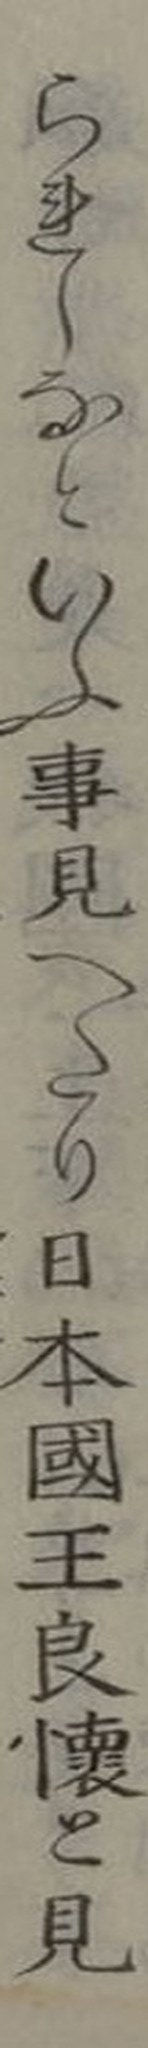られしなといふ事見へたり日本國王良懐と見
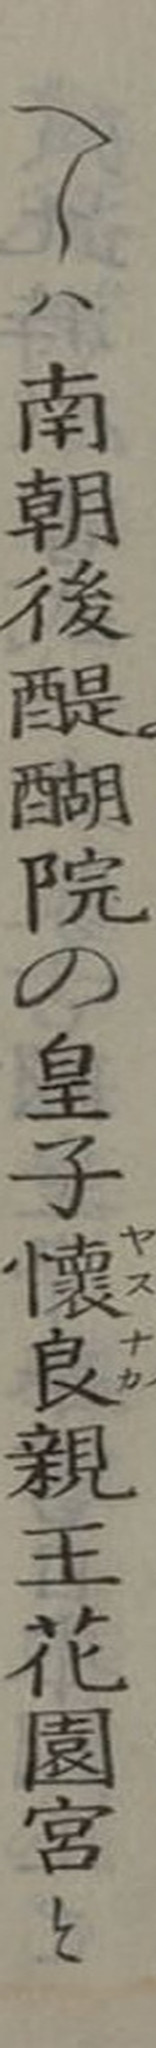へしハ南朝後醍醐院の皇子懷良親王花園宮と
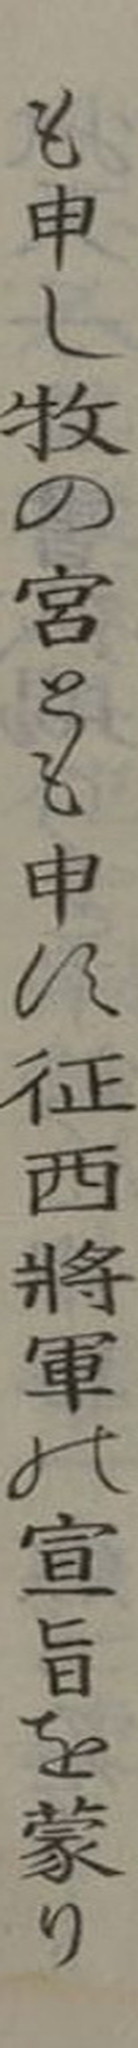も申し牧の宮とも申す征西將軍の宣旨を蒙り
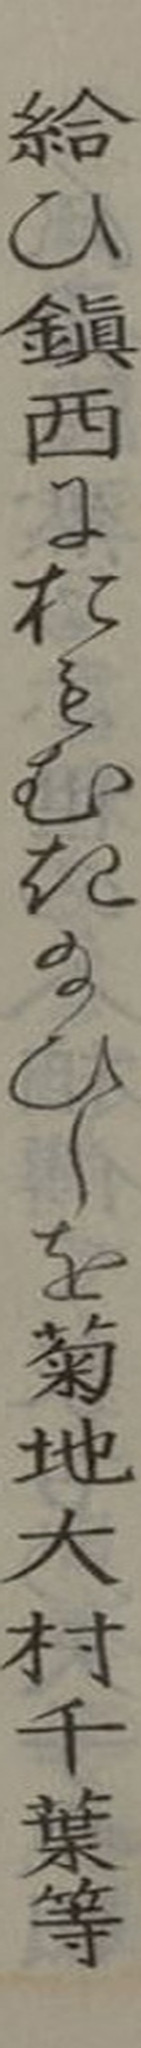給ひ鎮西におもむき給ひしを菊地大村千葉等
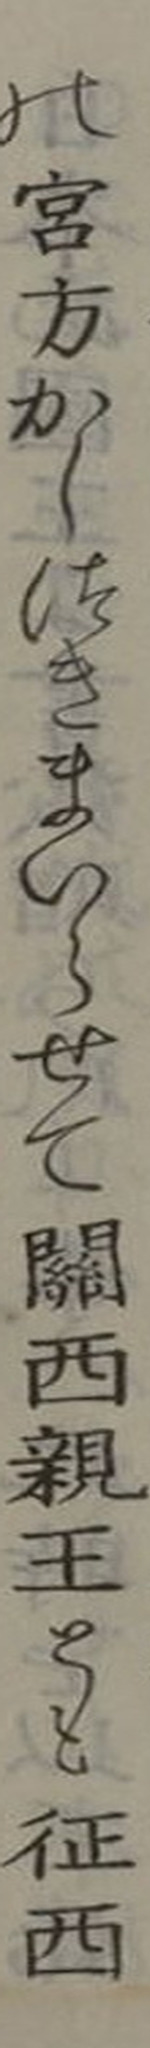の宮方かしつきまひらせて關西親王家とも征西
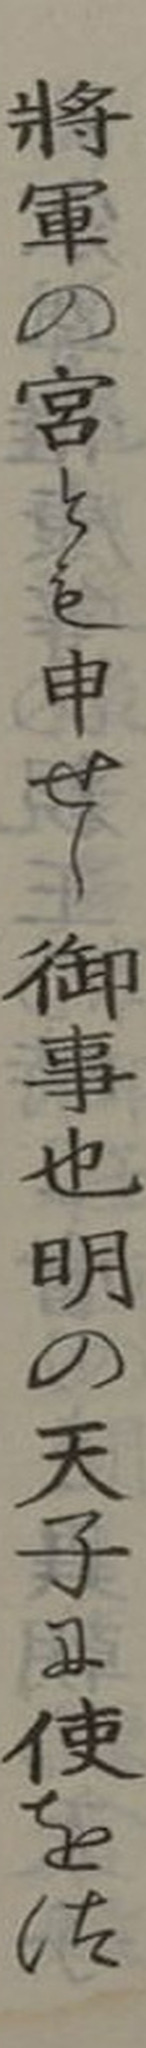將軍の宮とも申せし御事也明の天子に使をつ
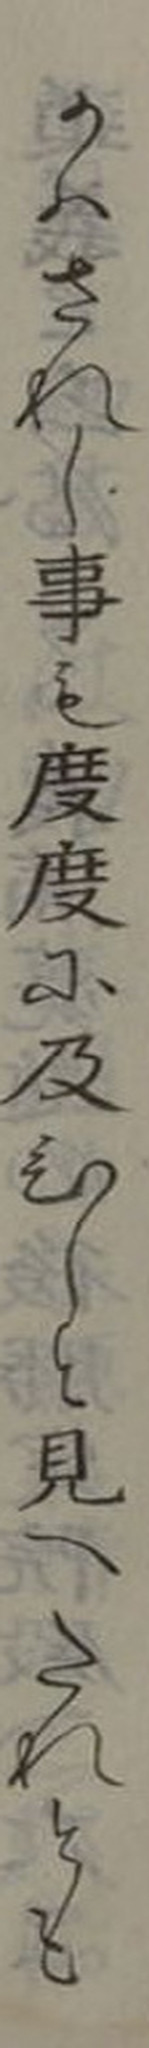かハされし事も度度に及ひしと見へたれとも
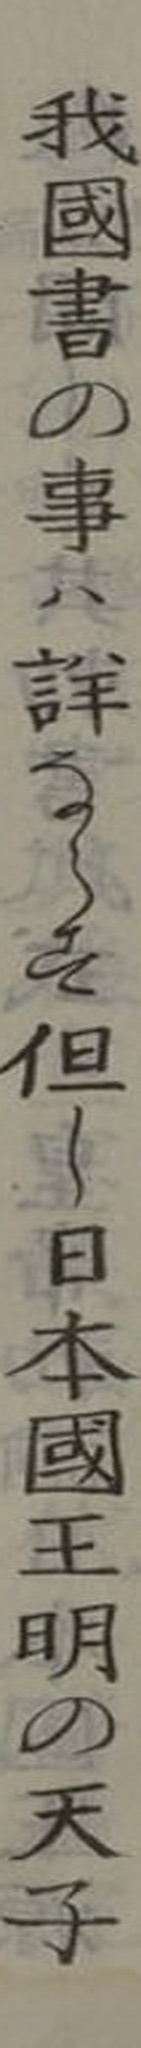我國書の事ハ詳ならす但し日本國王明の天子
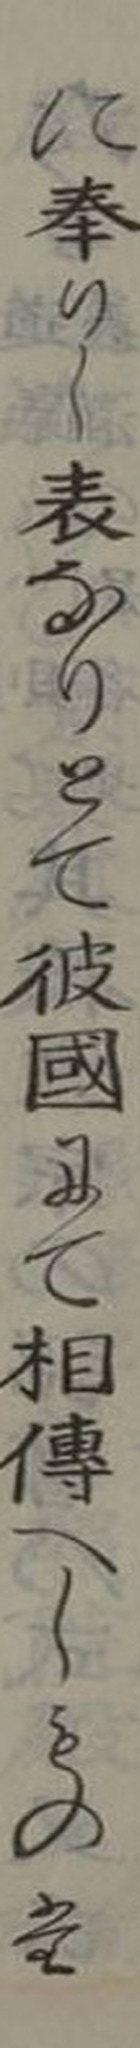に奉りし表なりとて彼國にて相傳へしものは
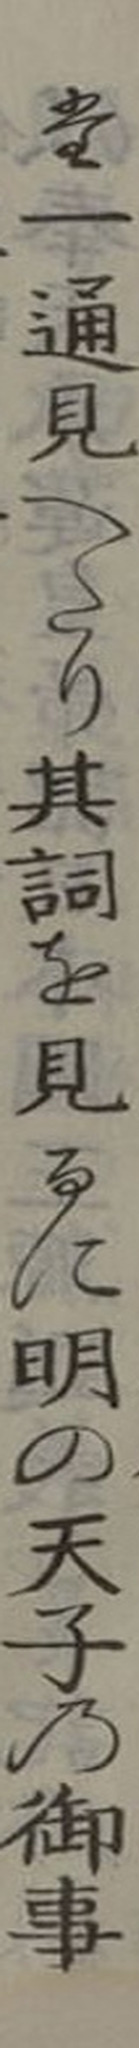は一通見へたり其詞を見るに明の天子の御事
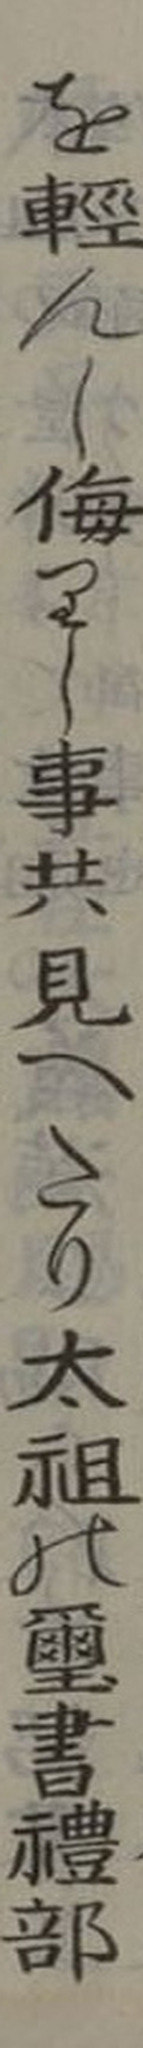を輕んし侮りし事共見へたり太祖の璽書禮部
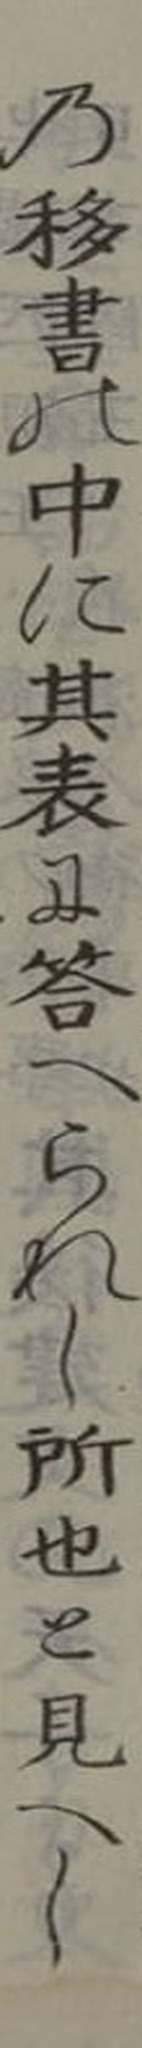の移書の中に其表に答へられし所也と見へし
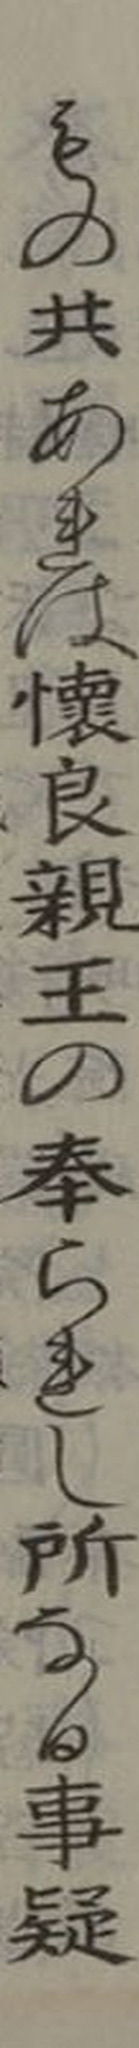もの共あれは懐良親王の奉られし所なる事疑
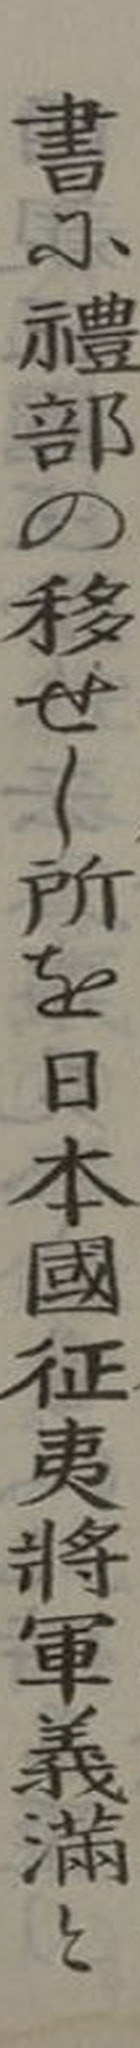書に禮部の移せし所を日本國征夷將軍義滿と
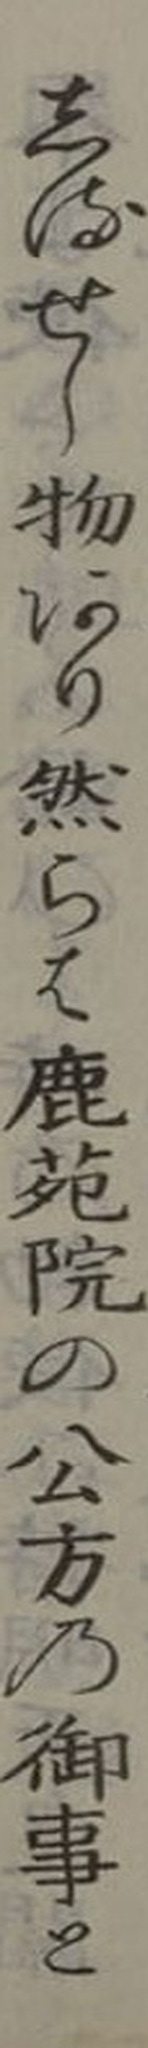しるせし物あり然らは鹿苑院の公方の御事と
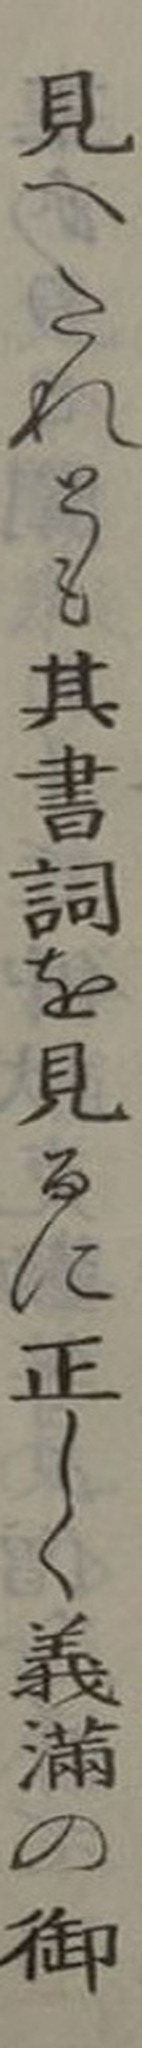見へたれとも其書詞を見るに正しく義滿の御
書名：骨董録
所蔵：University of the Ryukyus Library
